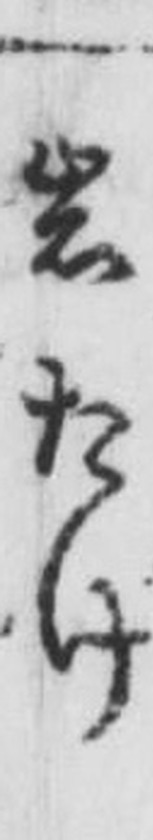岩たけ
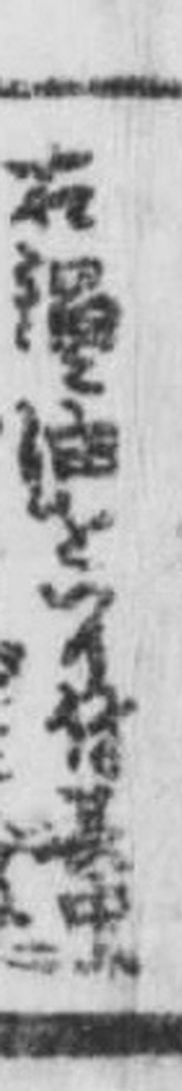右醤油をいり付其中に
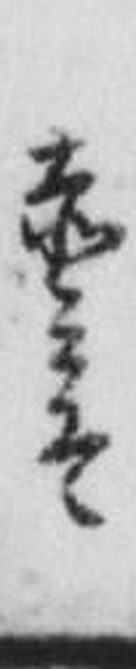赤みそ
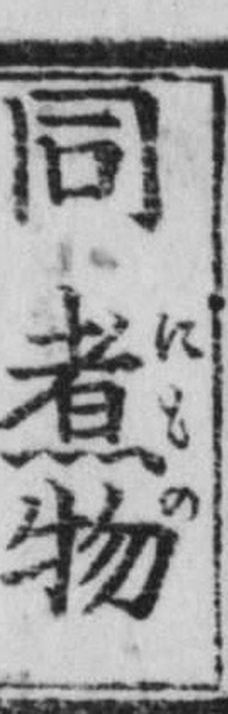同煮物
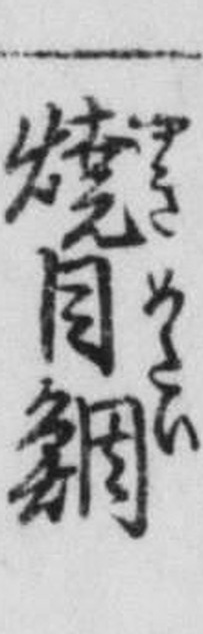焼目鯛
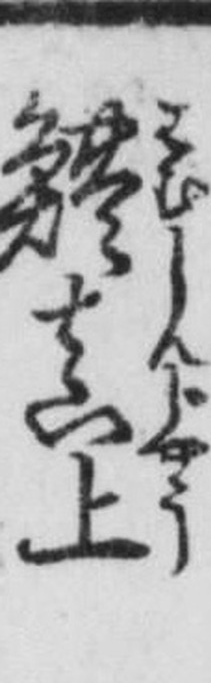鱧真上
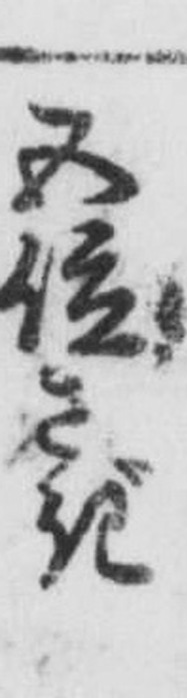五位さぎ
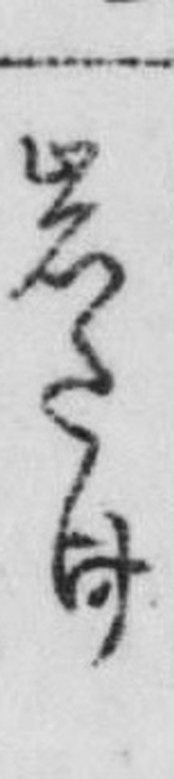岩たけ
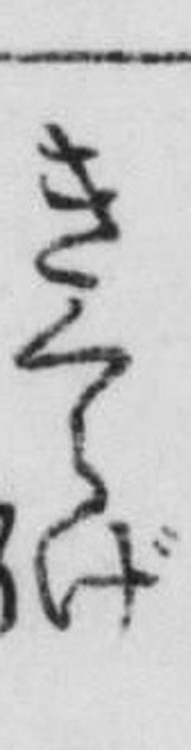きくらげ
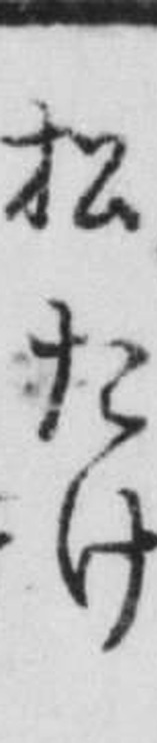松たけ
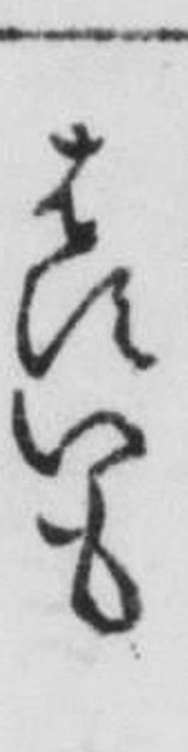はすいも
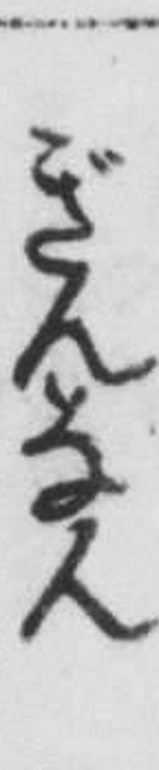ぎんなん
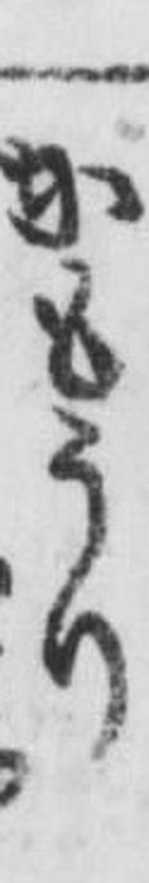かもうり
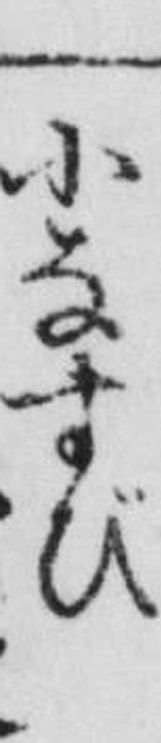小なすび
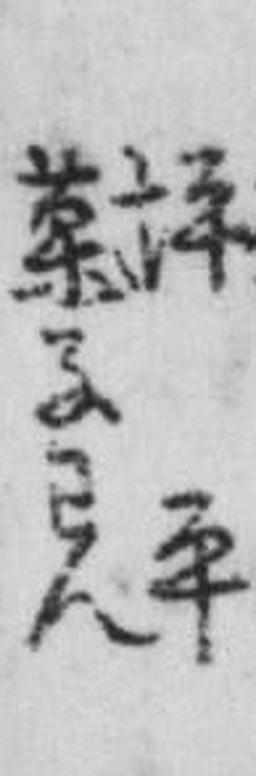菓子わん
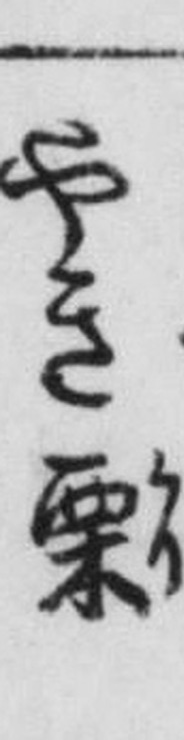やき栗
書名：精進魚類間合料理/早速庖丁
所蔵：大阪府立大学学術情報センター 国文学研究資料館
